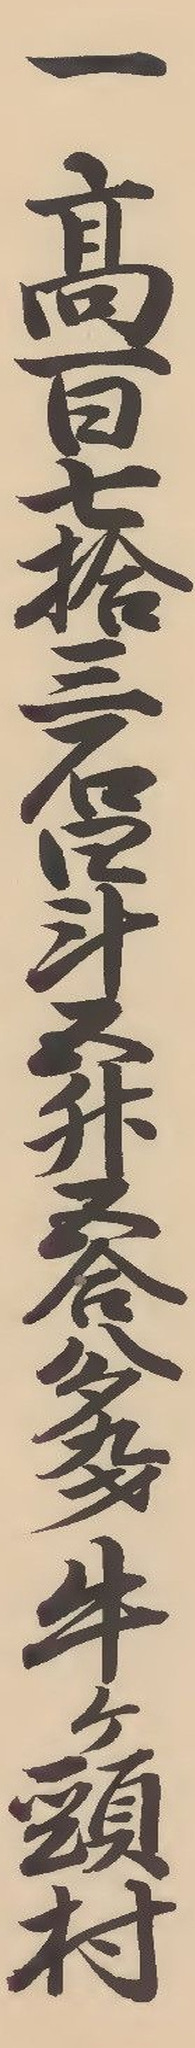一高百七拾三石四斗五升五合八勺九才牛ヶ頭村

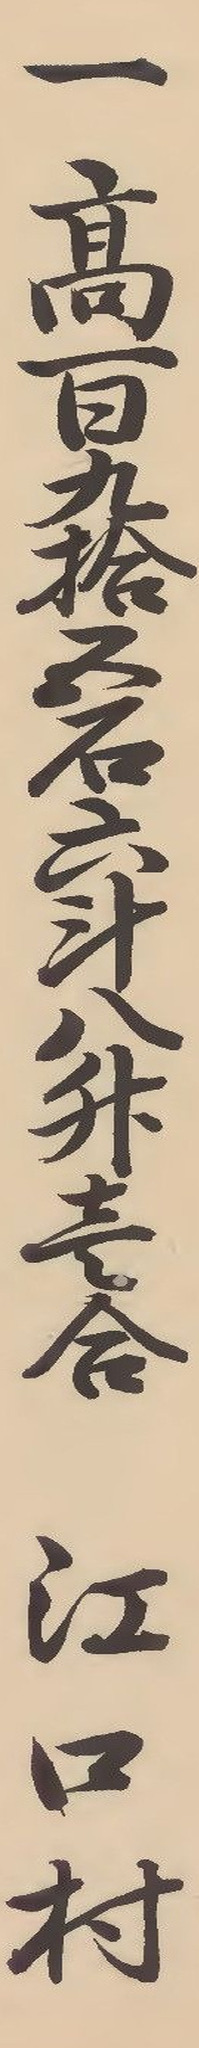一高百九拾五石六斗八升壱合江口村
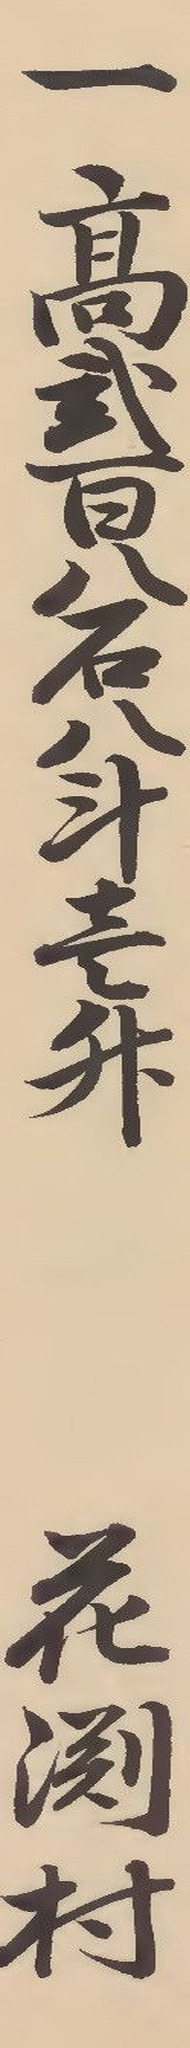一高弐百八石八斗壱升花淵村
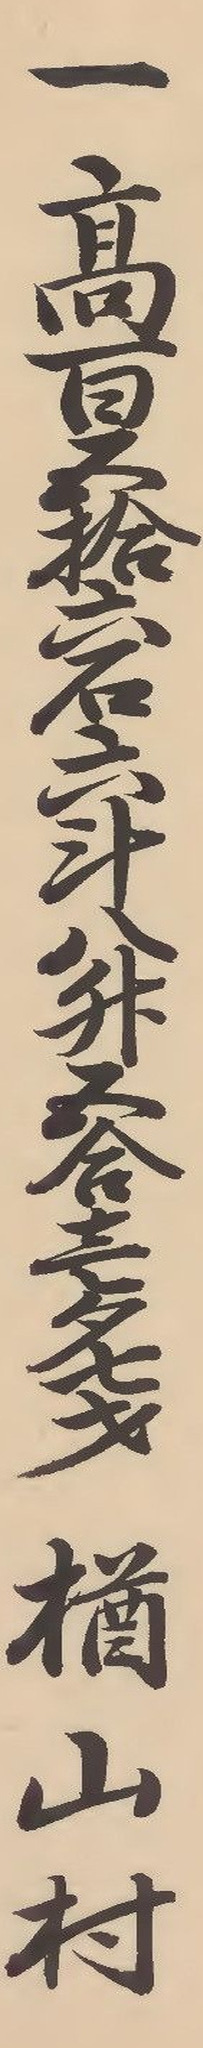一高百五拾六石六斗八升五合壱勺七才楢山村
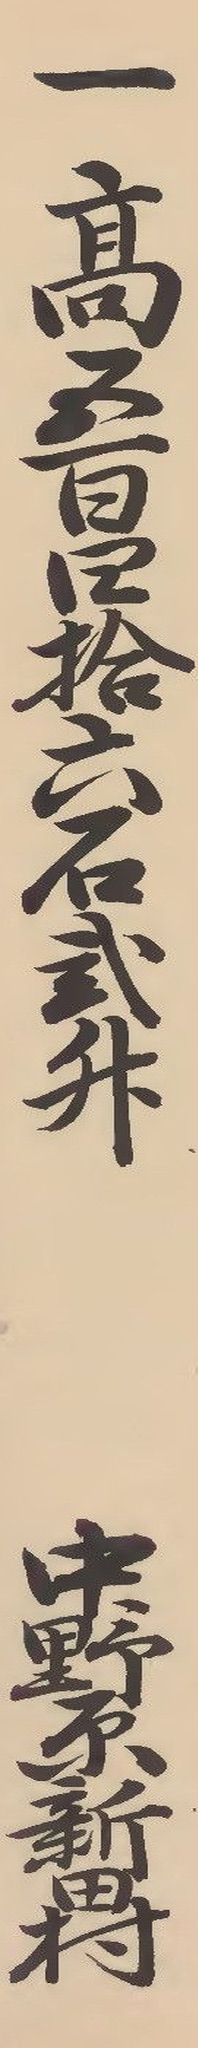一高五百四拾六石弐升中野原新田村
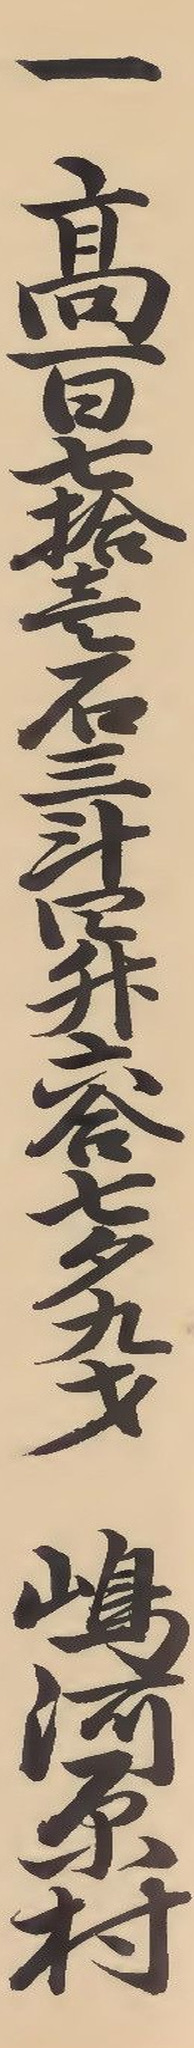一高百七拾壱石三斗四升六合七勺九才島河原村
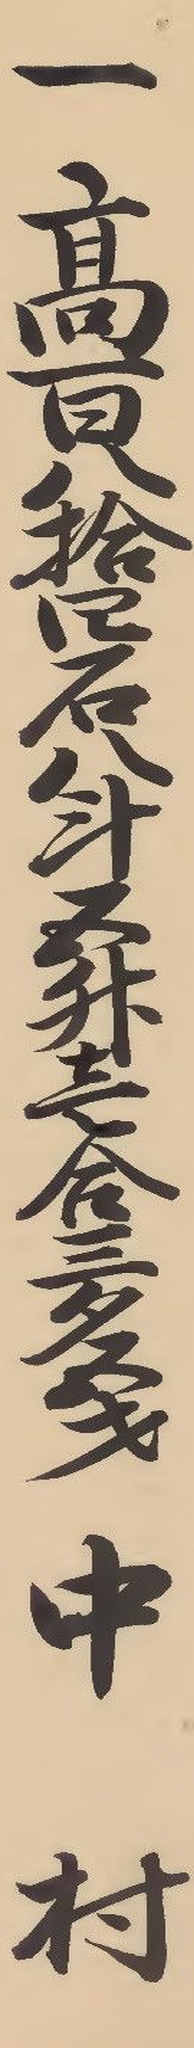一高百八拾四石八斗五升壱合三勺五才中村
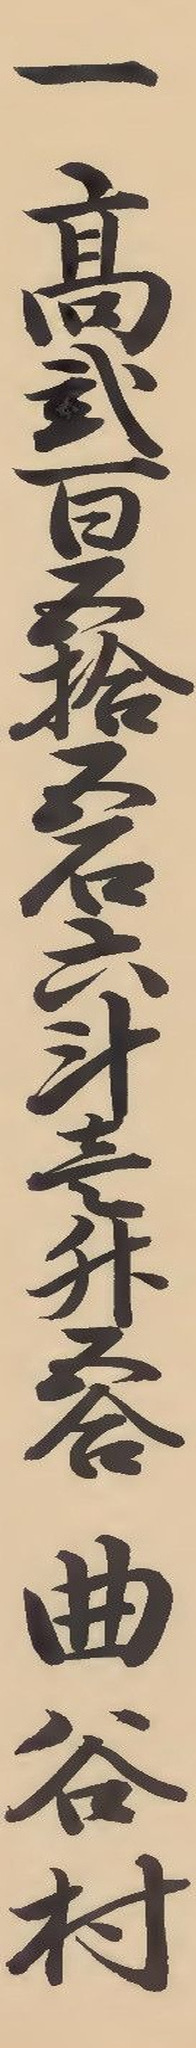一高弐百五拾五石六斗壱升五合曲谷村
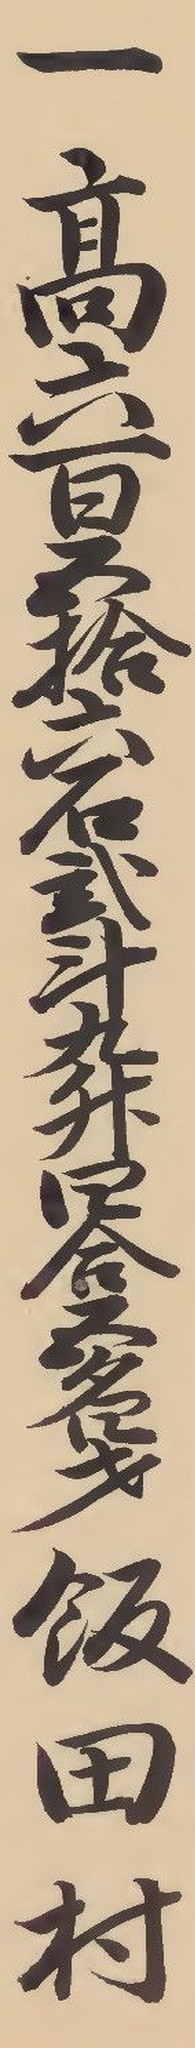一高六百五拾六石弐斗九升四合五勺四才飯田村

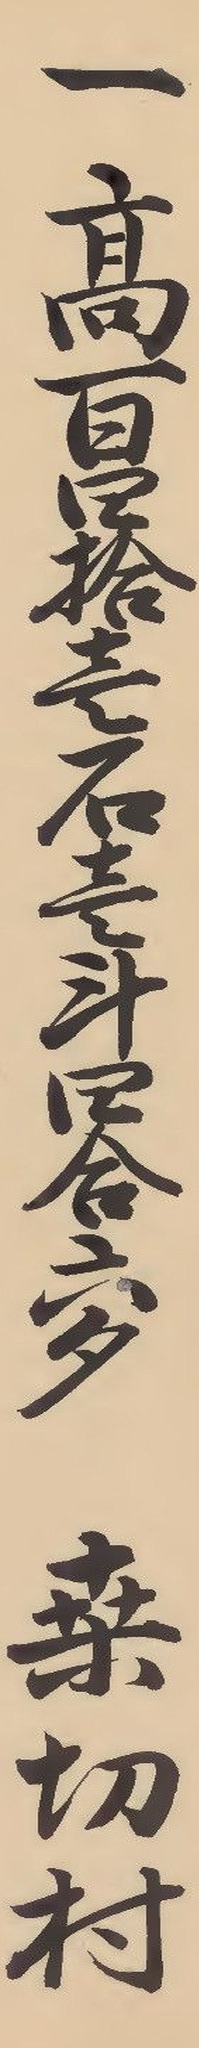一高百四拾壱石壱斗四合六勺桑切村
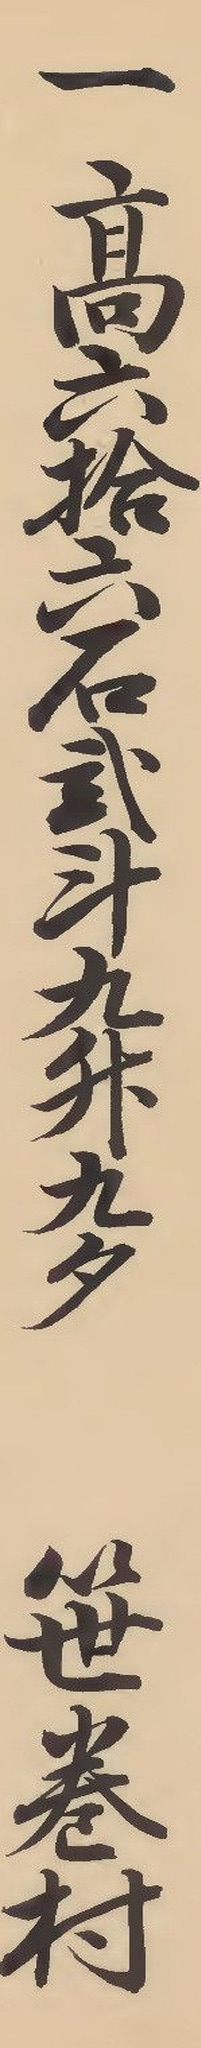一高六拾六石弐斗九升九勺笹巻村
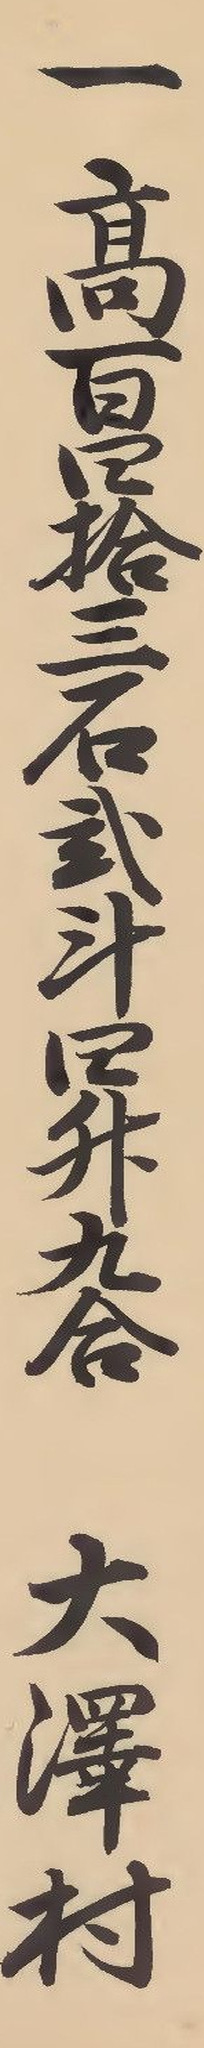一高百四拾三石弐斗四升九合大沢村
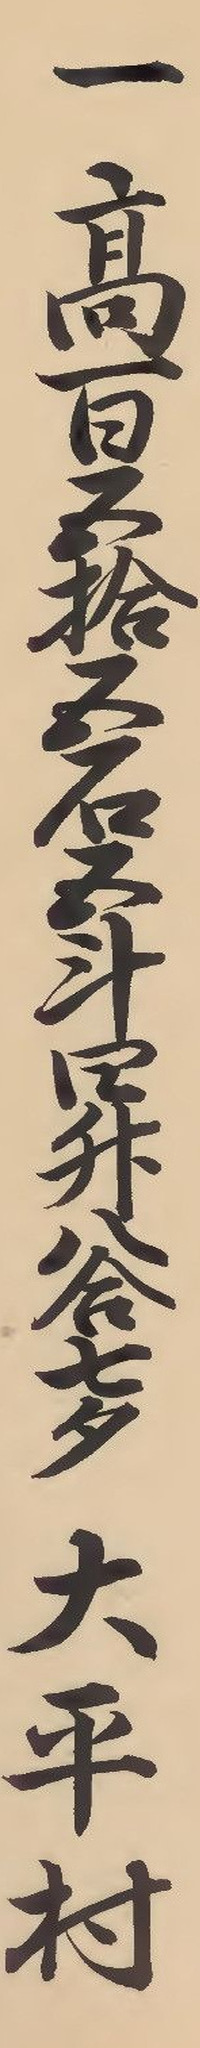一高百五拾五石五斗四升八合七勺大平村
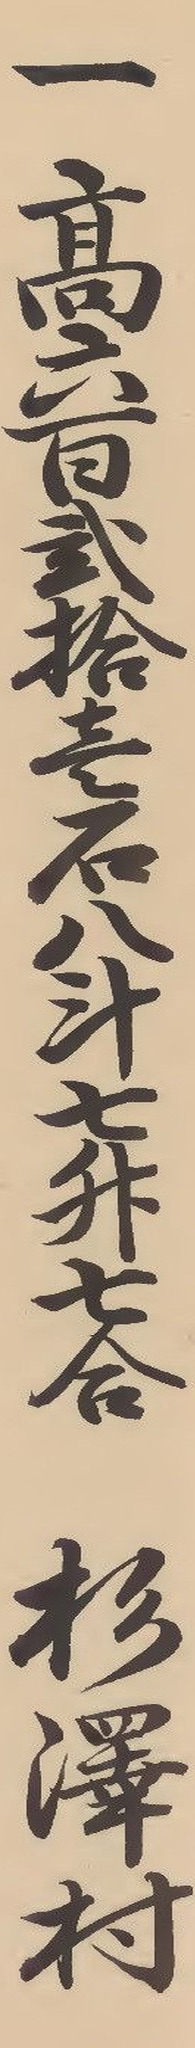一高六百弐拾壱石八斗七升七合杉沢村
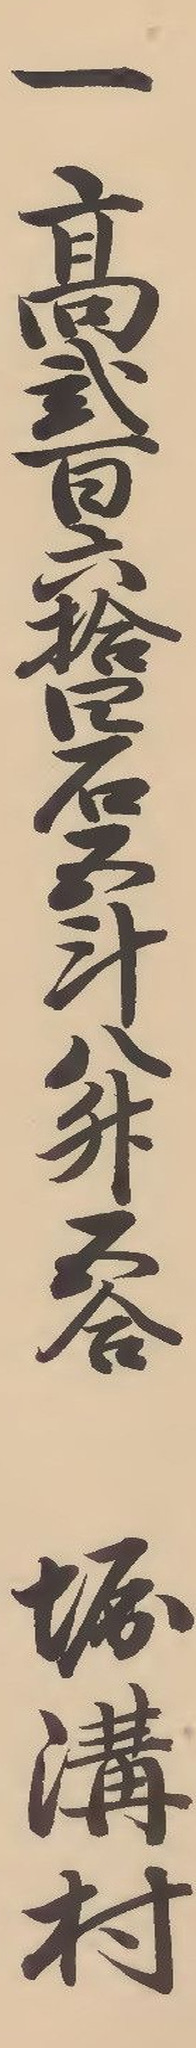一高弐百六拾四石五斗八升五合堀溝村
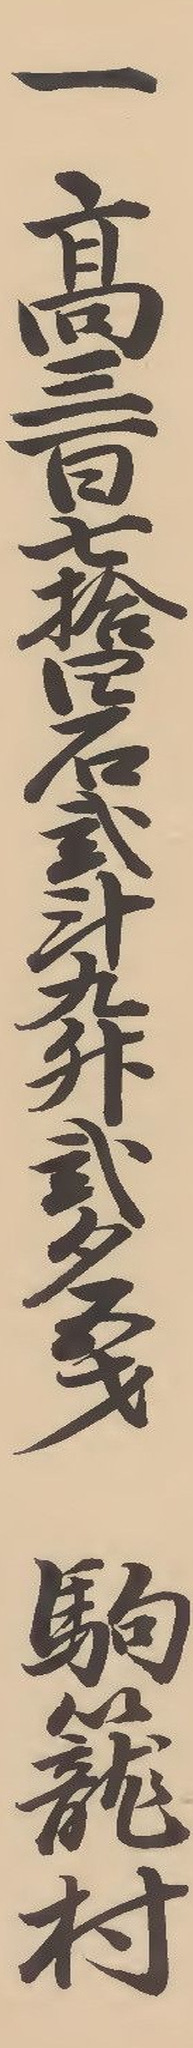一高三百七拾四石弐斗九升弐勺五才駒篭村
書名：越後国郷帳　下
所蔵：国立公文書館 National Archives of Japan
